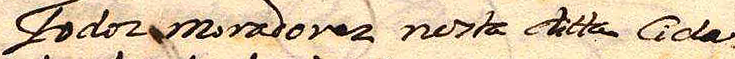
Todoz moradorez nesta ditta Cida
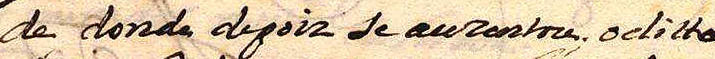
de donde depoiz se auzentou; o ditto
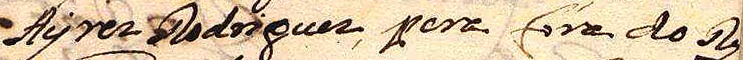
Ayrez Rodriguez, pera fora do Re_
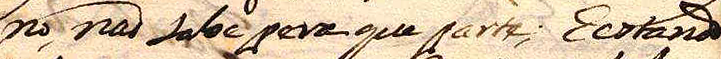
no, naõ sabe pera que parte; E estando
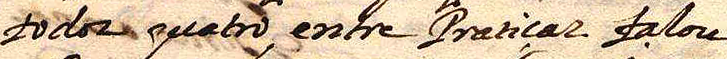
todoz quatro, entre Praticaz falou
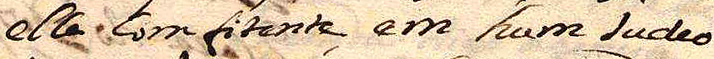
ella comfitente, em hum Iudeo
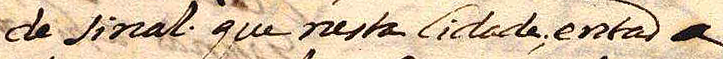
de sinal. que nesta Cidade, entaõ a
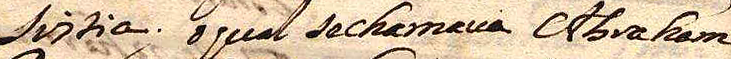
sistia; o qual se chamaua Abraham
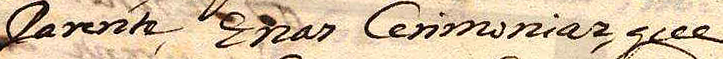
Parente, E nas Cerimoniaz, que
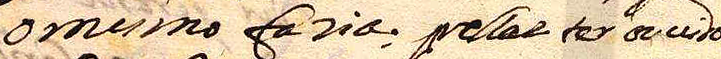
o mesmo fazia; pellaz ter ouuido
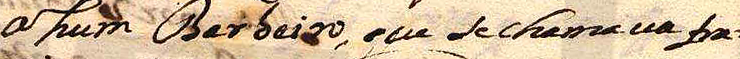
a hum Barbeiro, que se chamaua fra
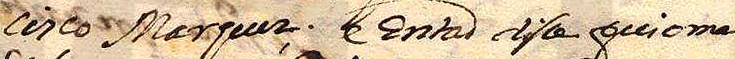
cisco Marquez; e Entaõ disse guiomar
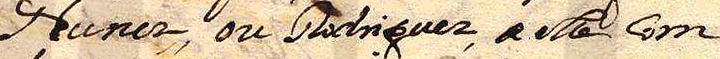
Nunez, ou Rodriguez, a elle com
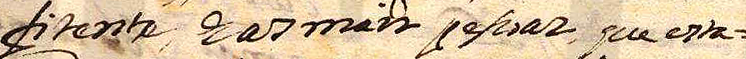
fitente; E as maiz pessoaz, que esta
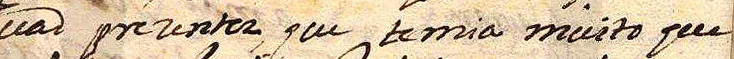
uaõ prezentez, que temia muito que
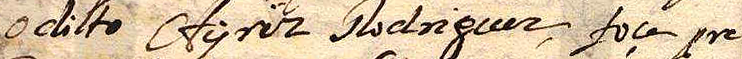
o ditto Ayriz Rodriguez, foçe pre
